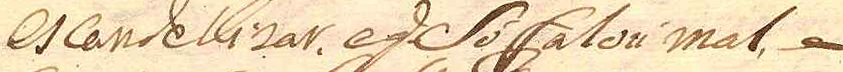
escandallizar e q̄ Só falou mal, e
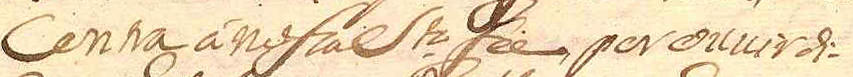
Contra á nossa Sta fee por ouuir di
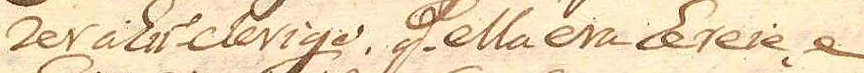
zer a hū clerigo, q̄ ella era hereie, e
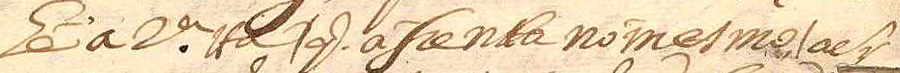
he a 2a. tta /q̄. assenta no mesmo,/ aSi
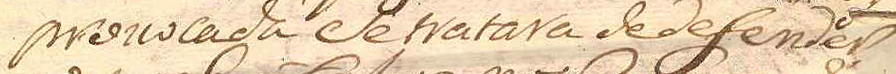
prouocada se tratara de defender
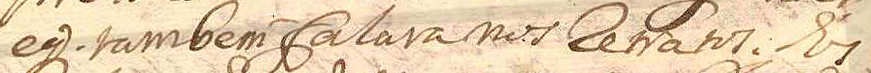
e q̄. tambem falava nos Retratos. dos
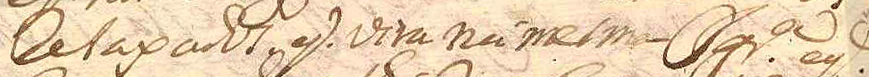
Relaxados q̄ vira na mesma Igr.a e q̄
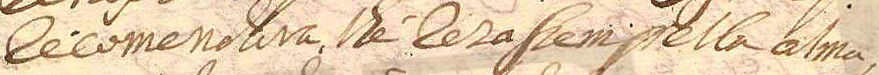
Recomendara, lhe Rezassem pella alma
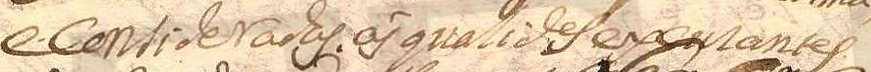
e considerados, as qualides excusantes
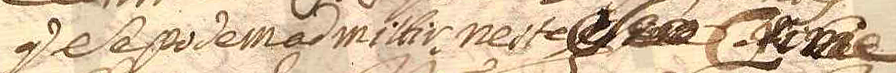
q̄ Se podem admittir neste Seu Crime
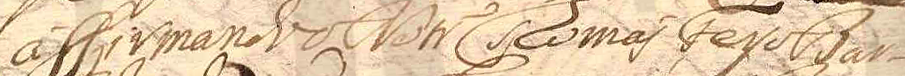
affirmando o Notr.o Thomás Feyo Bar
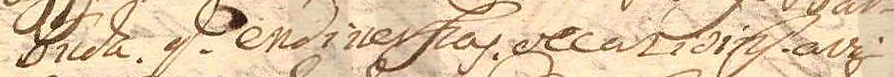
buda. q̄. en diuersas, occazioins a vi
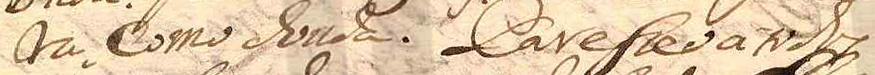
ra Como douda. Paresseo a todos
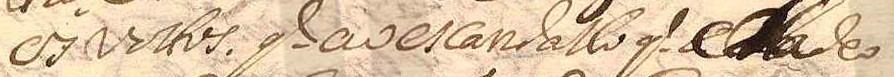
os vottos. q̄. ao escandallo q̄ ella deo
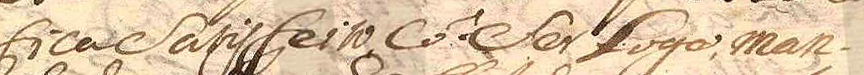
fica satisfeito, cō Ser logo, man
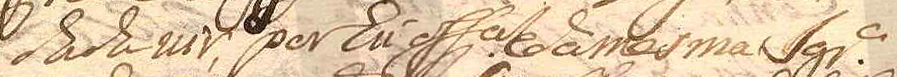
dada uir por hū off.al da mesma Igr.a
